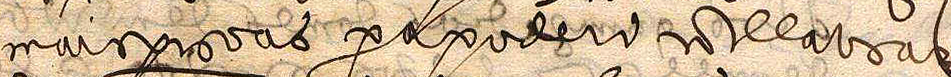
mais pesoas ꝑa poderē cō ella vsar
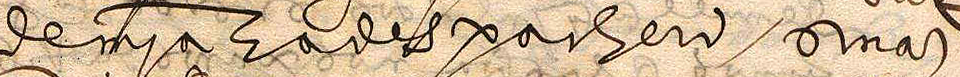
de m̄ja E a despacherē / senā
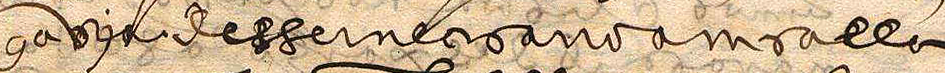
q̄ avya de sser necesario acusalla
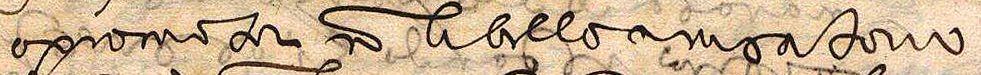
o promotor cō libello acusatorio
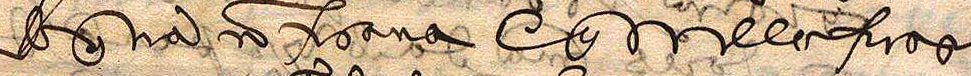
do q̄ nā cōfesaua e q̄ se ella ficase
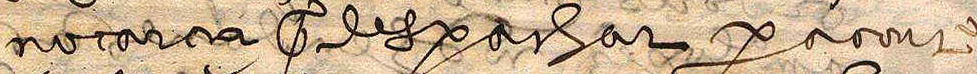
no carcere p̄o despachar ꝑa o outo
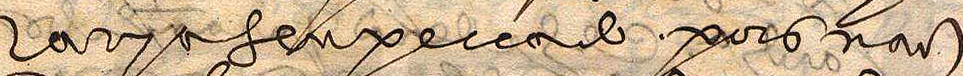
rarja seu peccado pois naõ
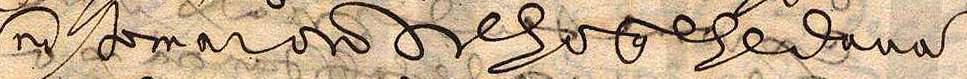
nē tomar o cōselho q̄ lhe dauā
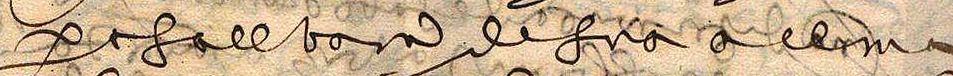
ꝑa sallvaçā de sua allma
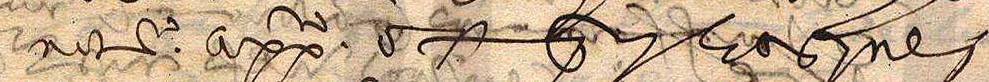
notro appco. o stp̄yj E asjnej
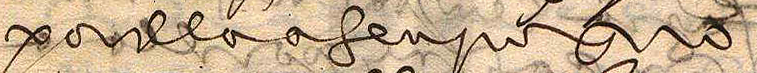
por ella a seu roguo
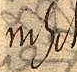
nihil
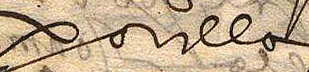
por ella
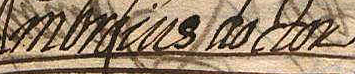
Ambrosius doctor
